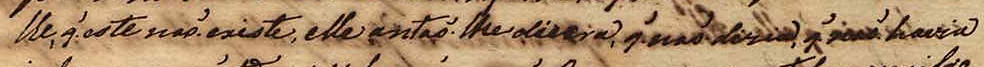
lhe, q̄ este naõ existe, elle antaõ lhe dicera, q̄ naõ dezia, q̄ naõ havia
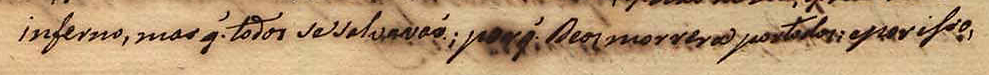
inferno, mas q̄ todos se salvavaõ; porq̄ Deos morrera por todos: e por isso,
